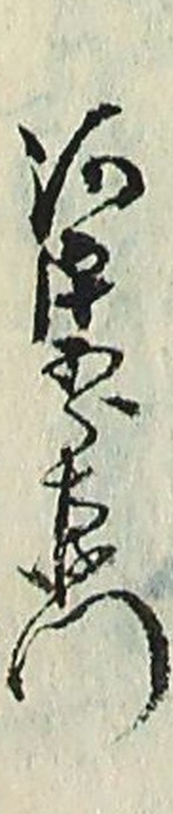河原五郎左衛門
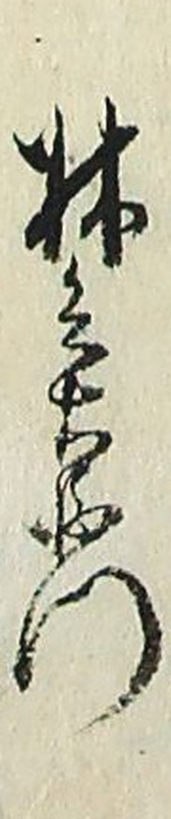林兵右衛門
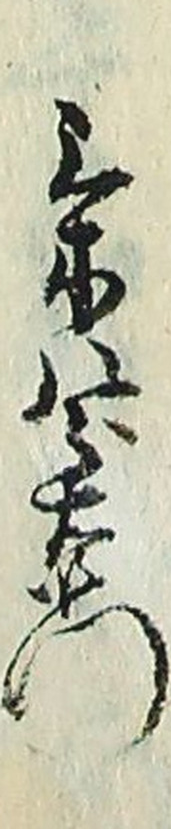三木八郎右衛門
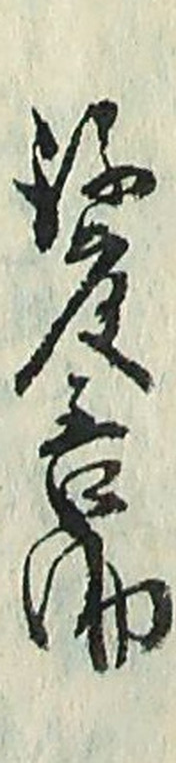後藤善助
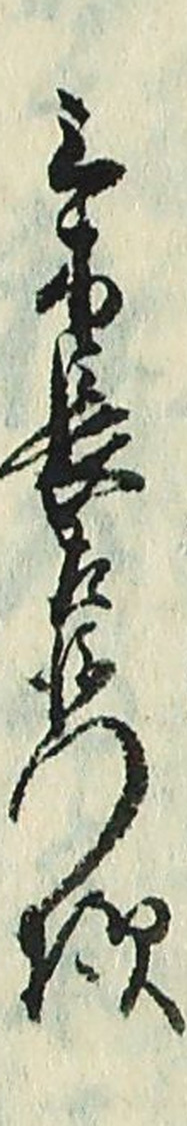三木長左衛門様

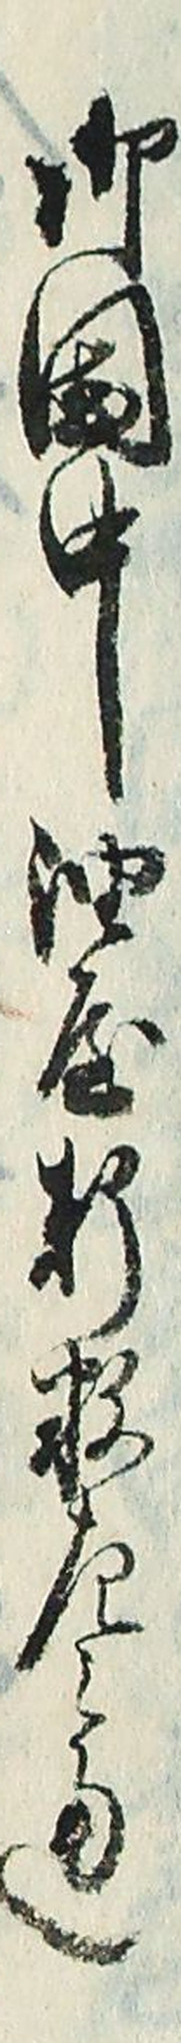御国中油屋軒数左之通
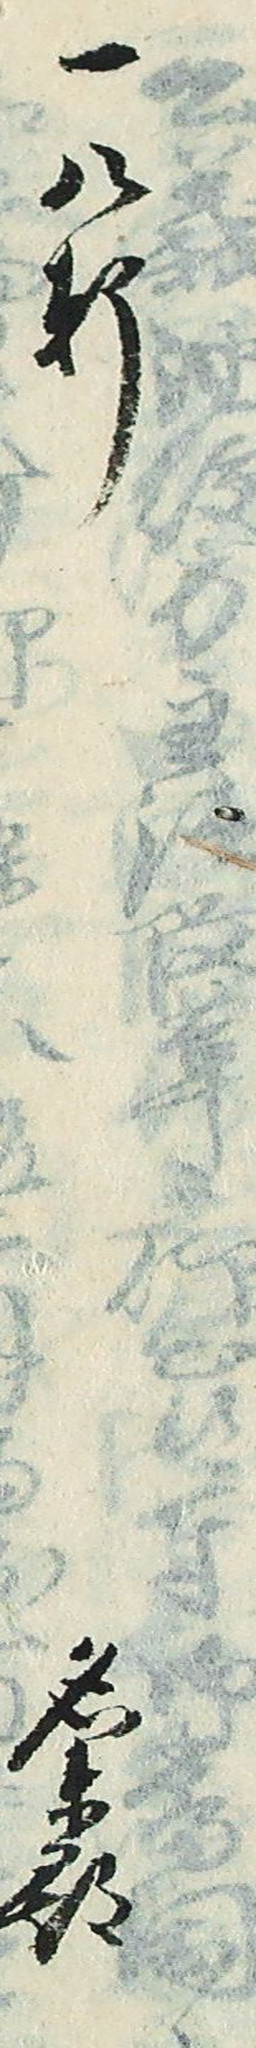一八軒名東郡
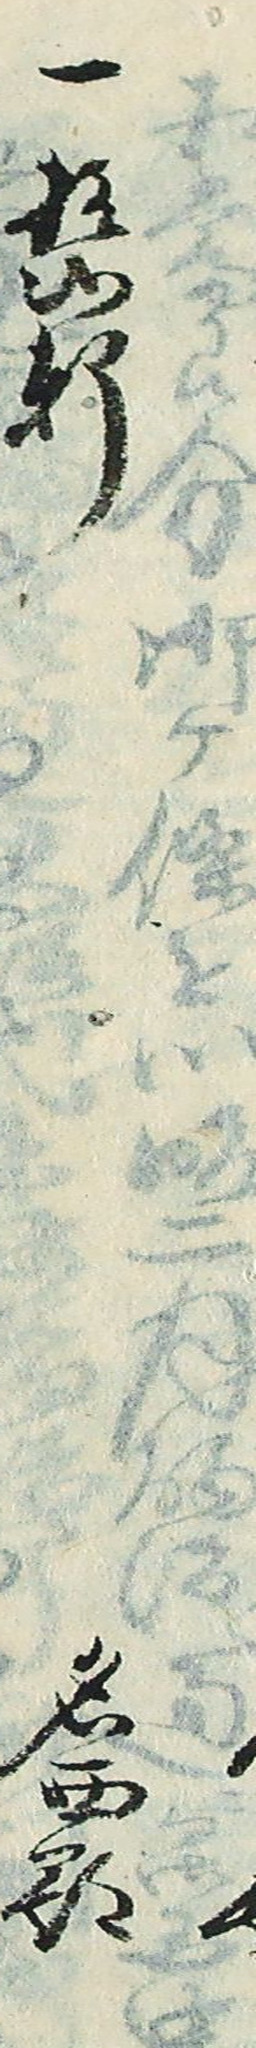一拾弐軒名西郡
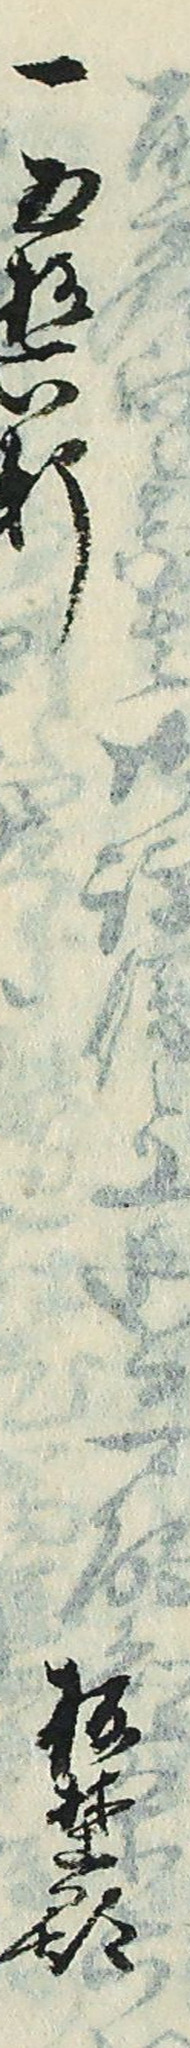一五拾六軒板野郡
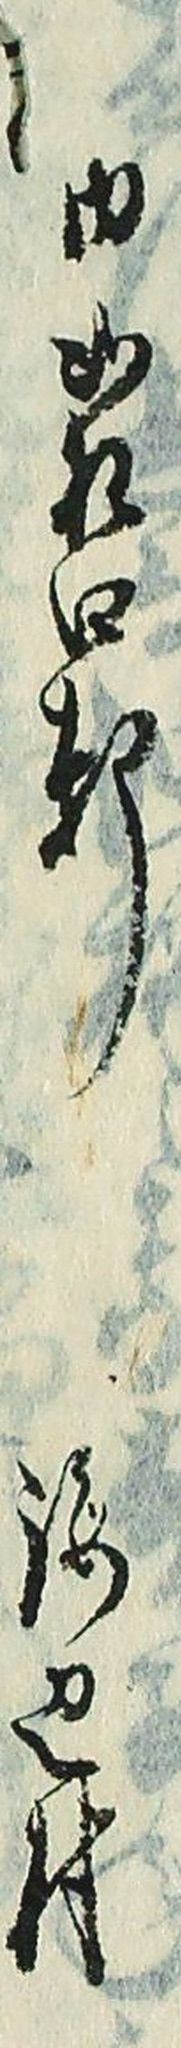内弐拾四軒海辺村
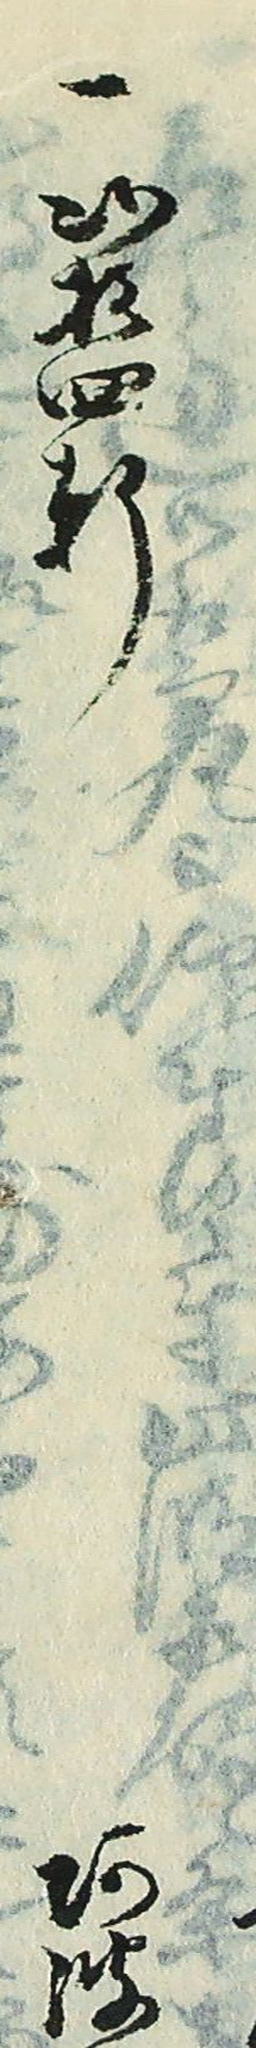一弐拾四軒阿波郡
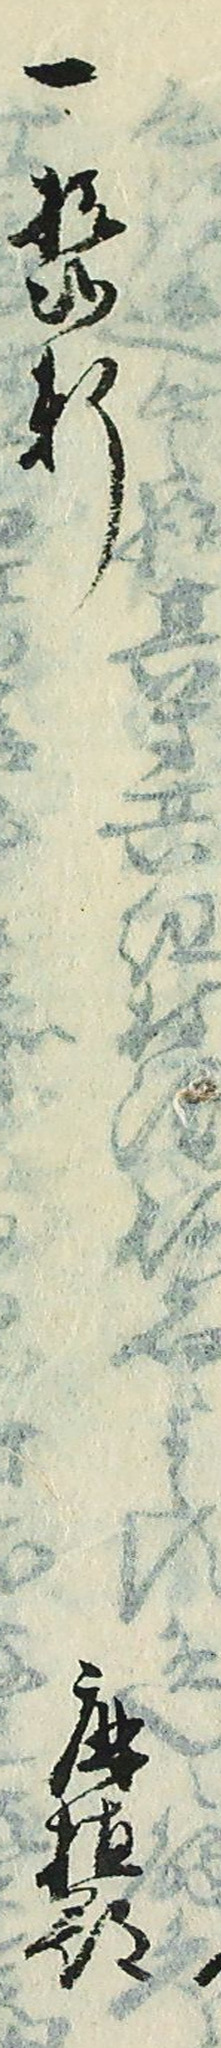一拾弐軒麻植郡
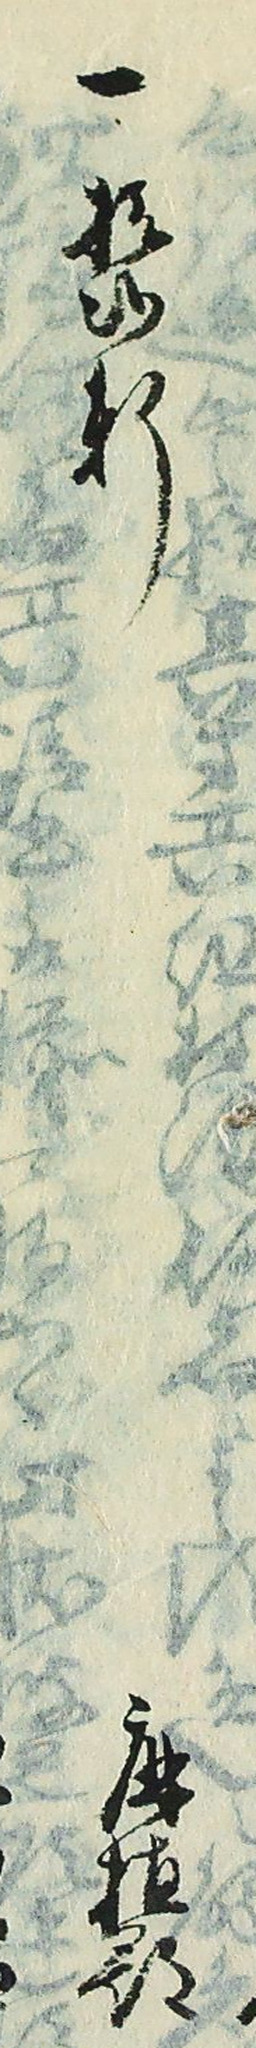一拾弐軒麻植郡
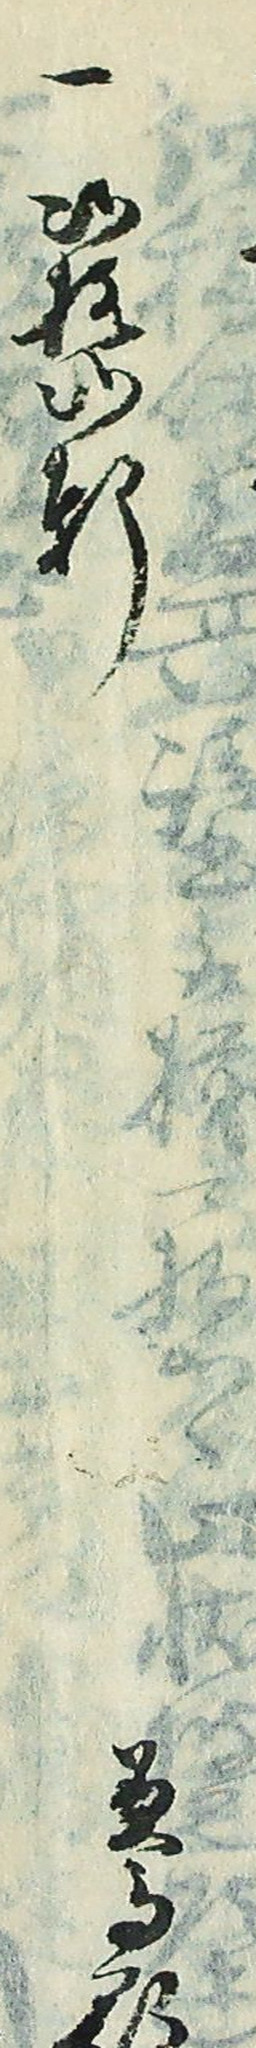一弐拾弐軒美馬郡
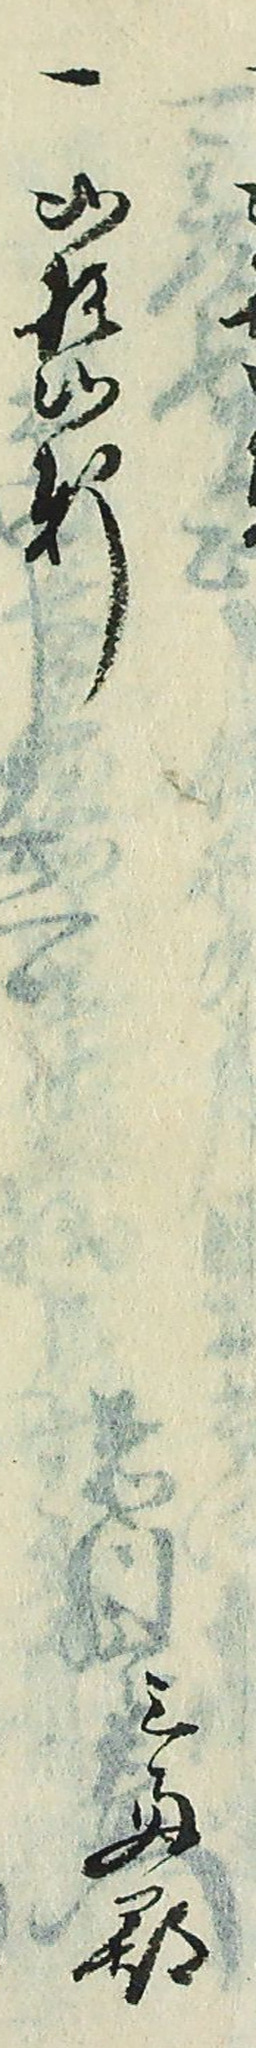一弐拾弐軒三好郡
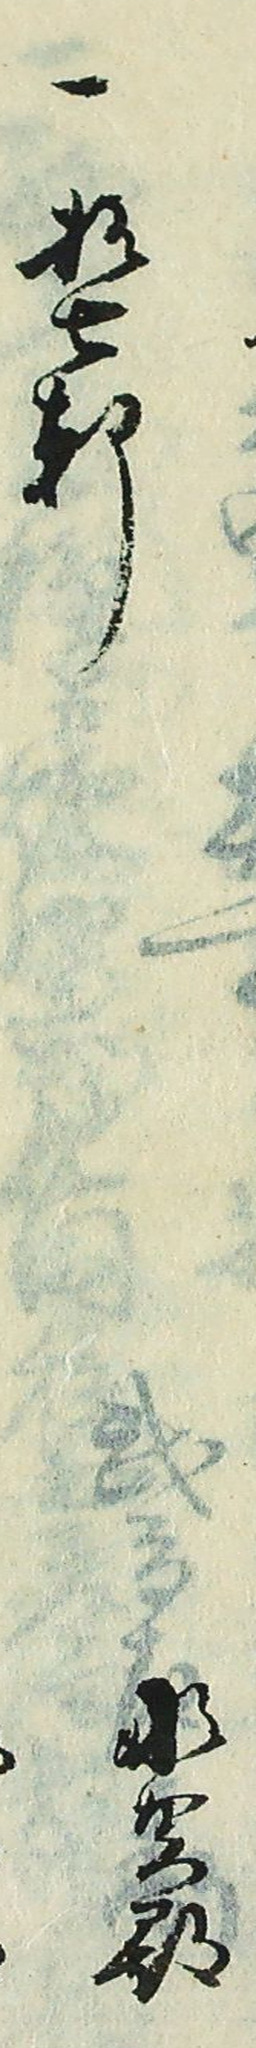一拾七軒那賀郡
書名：油稼御取究ニ附御箇條書テ以被仰渡南北同役申談御答書控
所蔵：鳴門教育大学 Naruto University of Education
